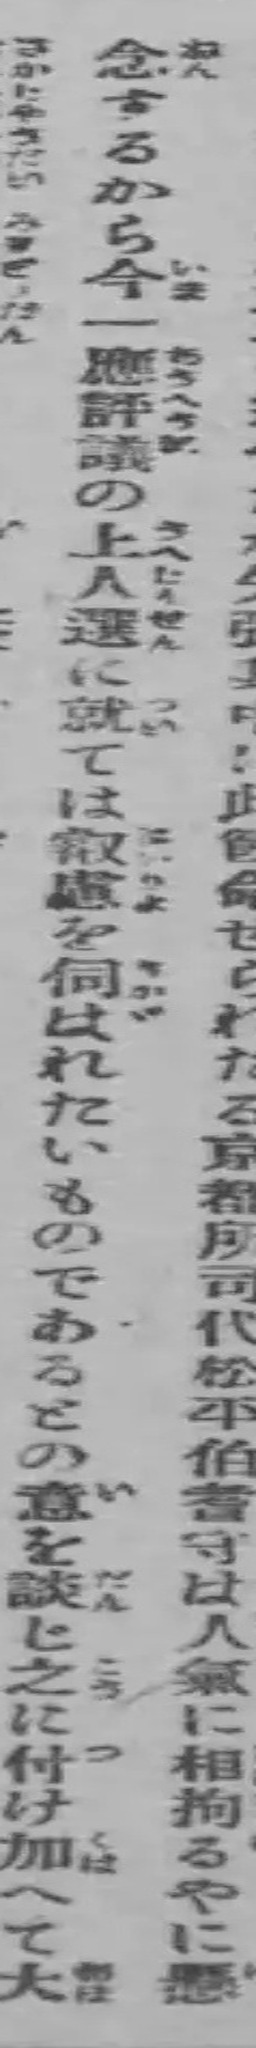念するから今一応評議の上人選に就ては叡慮を伺はれたいものであるとの意を談じ之に付け加へて大
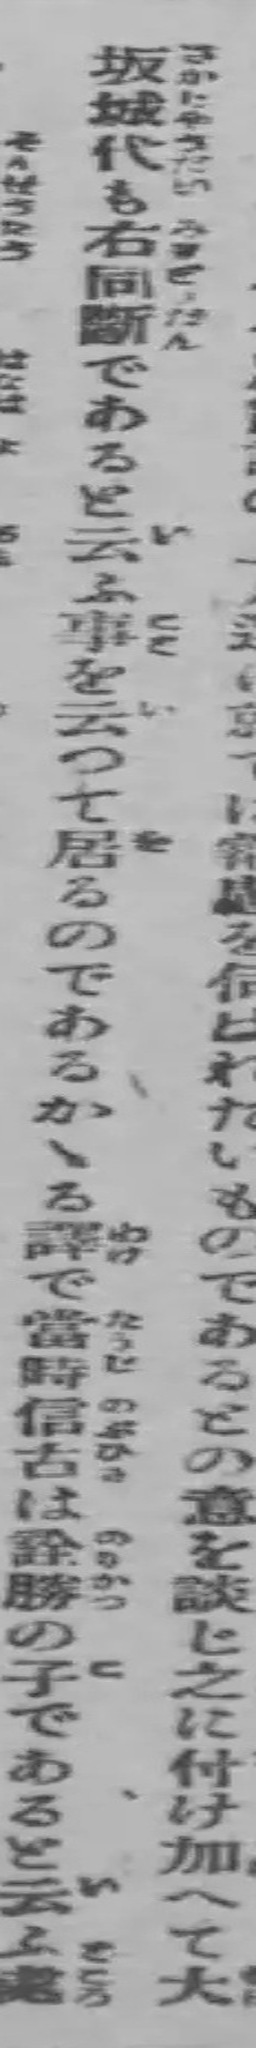坂城代も右同断であると云ふ事を云つて居るのであるかゝる訳で当時信古は詮勝の子であると云ふ処
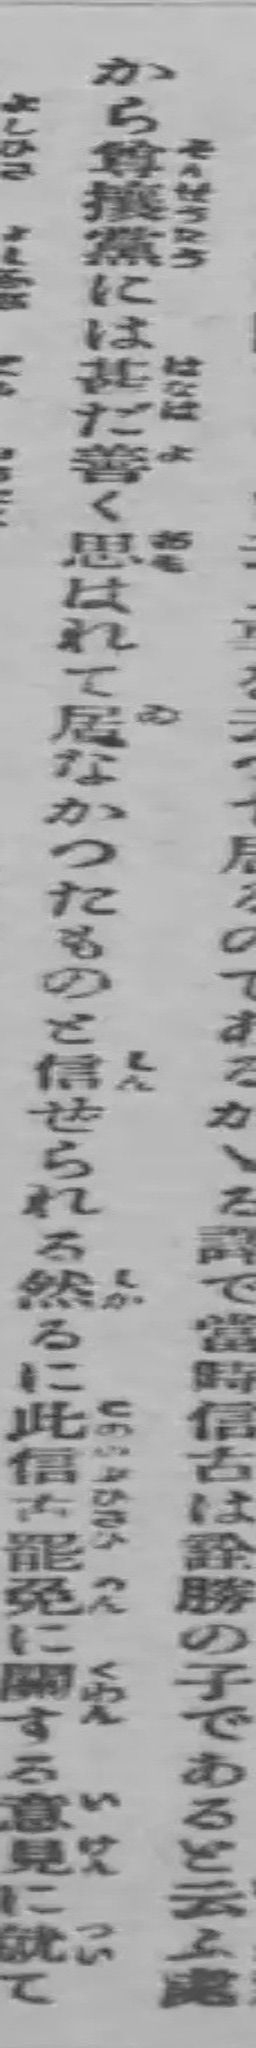から尊攘党には甚だ善く思はれて居なかつたものと信ぜられる然るに此信古罷免に関する意見に就て
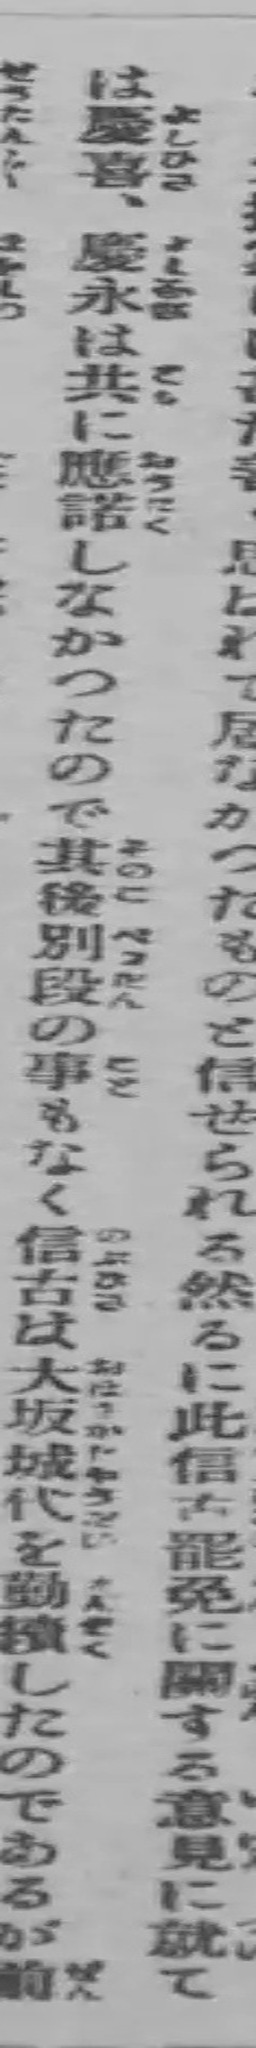は慶喜、慶永は共に応諾しなかつたので其後別段の事もなく信古は大坂城代を勤続したのであるが前
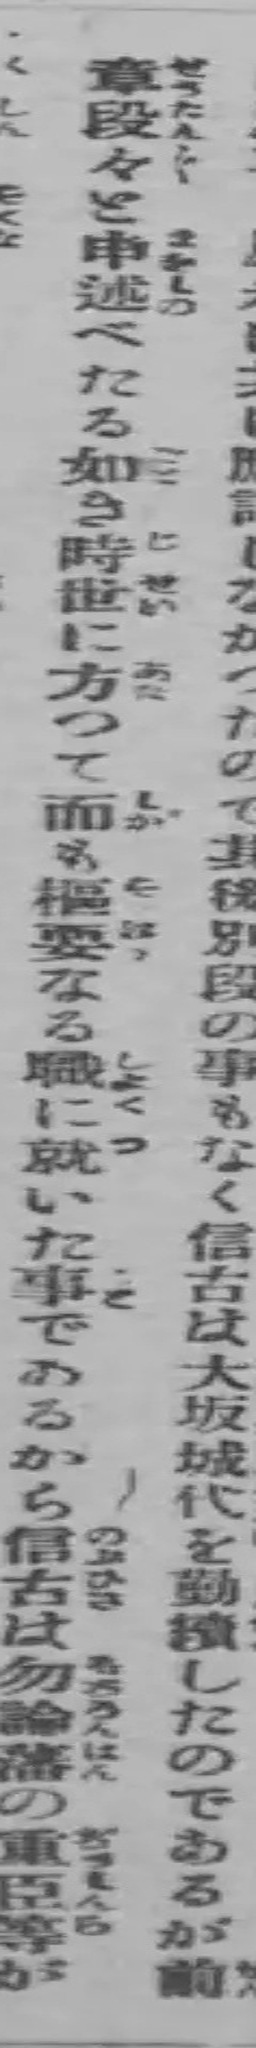章段々と申述べたる如き時世に方つて而も枢要なる職に就いた事であるから信古は勿論藩の重臣等が
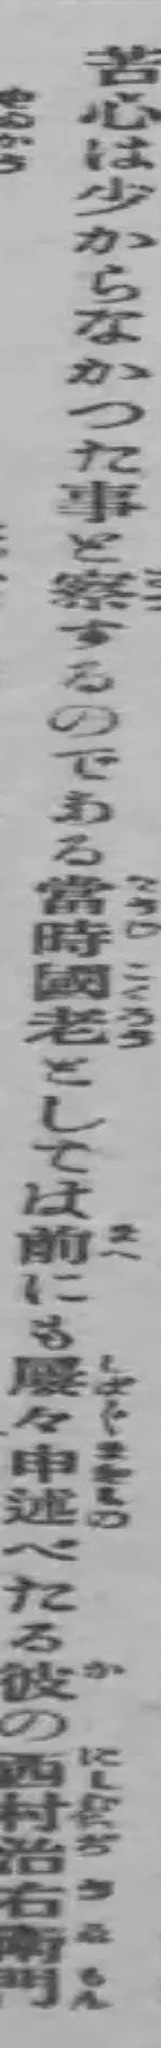苦心は少からなかつた事と察するのである当時国老としては前にも屡々申述べたる彼の西村治右衛門
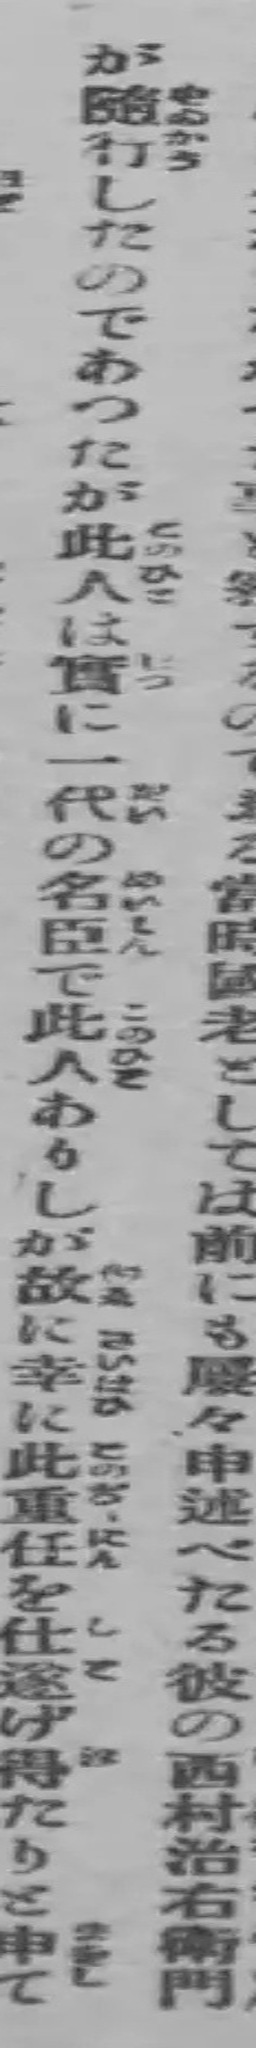が随行したのであつたが此人は実に一代の名臣で此人ありしが故に幸に此重任を仕遂げ得たりと申て
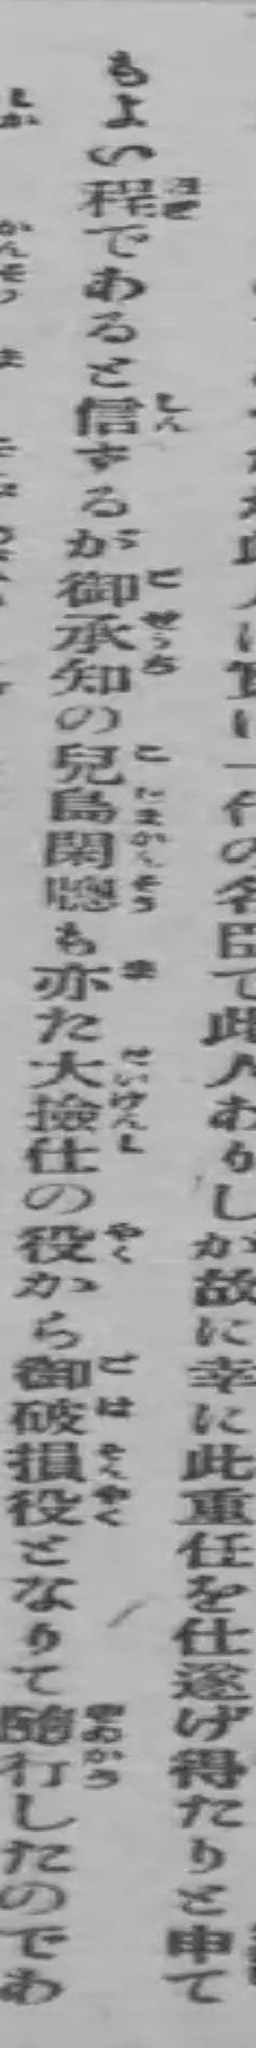もよい程であると信ずるが御承知の児島閑牕も亦た大検仕の役から御破損役となりて随行したのであ
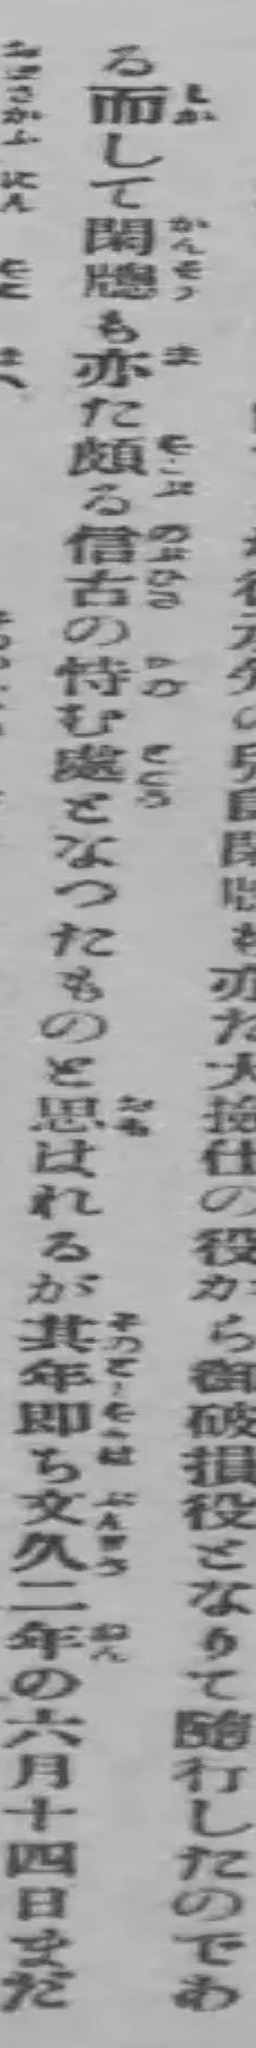る而して閑牕も亦た頗る信古の恃む処となつたものと思はれるが其年即ち文久二年の六月十四日まだ
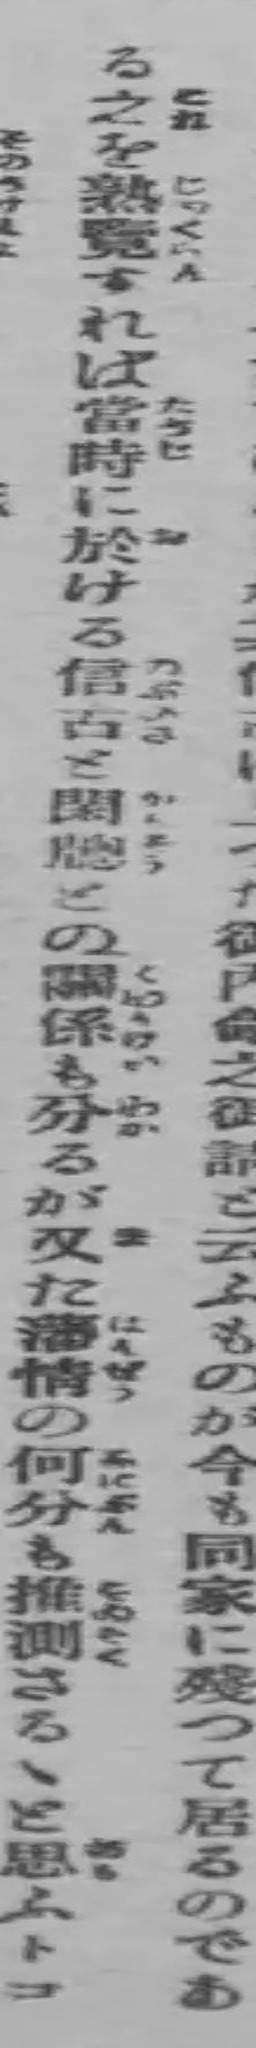る之を熟覧すれば当時に於ける信古と閑牕との関係も分るが又た藩情の何分も推測さるゝと思ふトコ
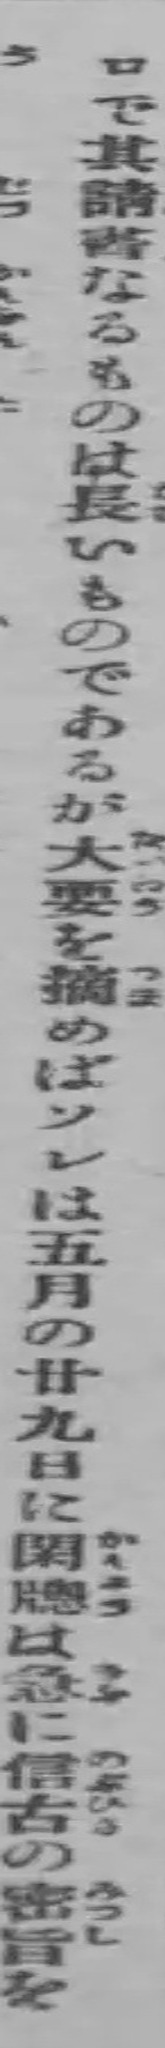ロで其請書なるものは長いものであるが大要を摘めばソレは五月の廿九日に閑牕は急に信古の密旨を
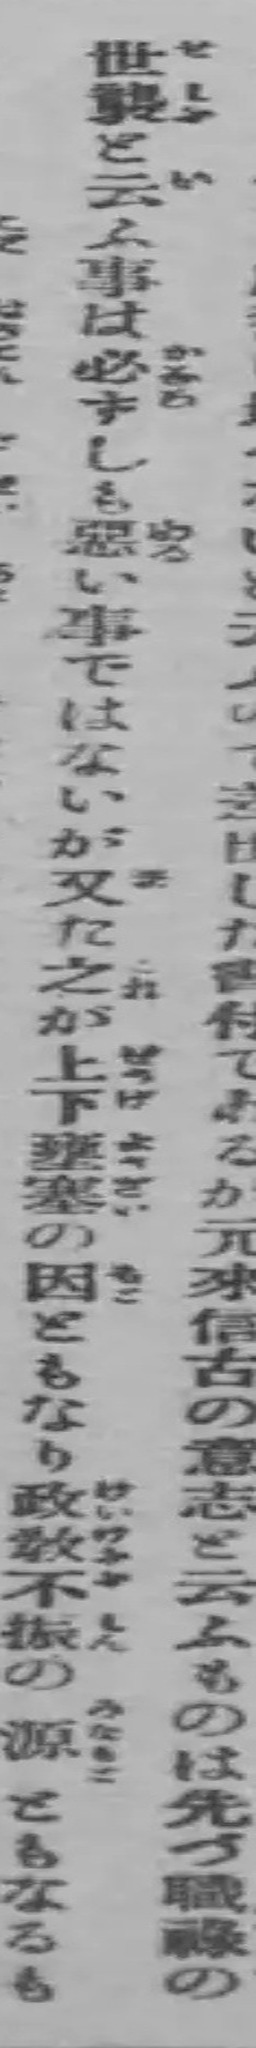世襲と云ふ事は必ずしも悪い事ではないが又た之が上下壅塞の因ともなり政教不振の源ともなるも
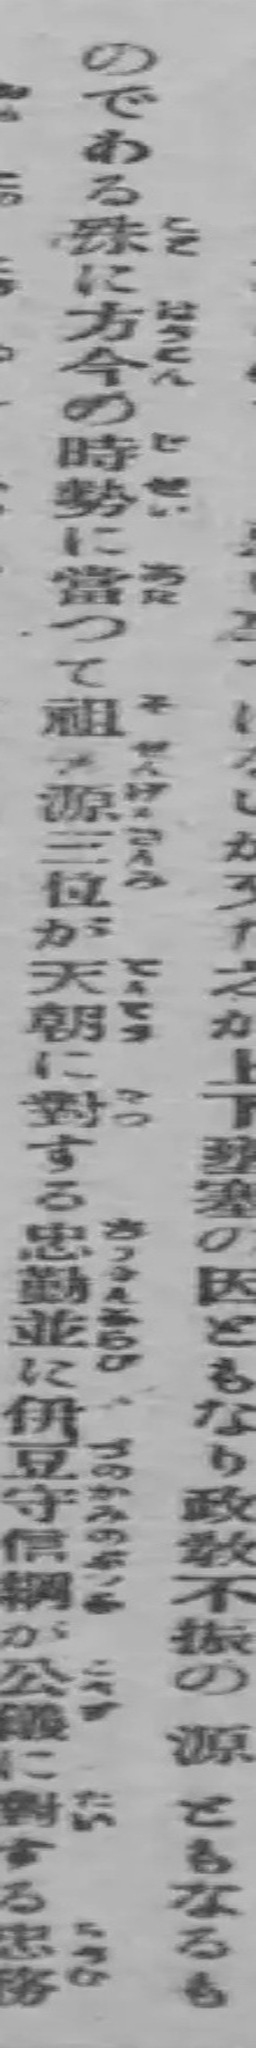のである殊に方今の時勢に当つて祖先源三位が天朝に対する忠勤並に伊豆守信綱が公儀に対する忠努
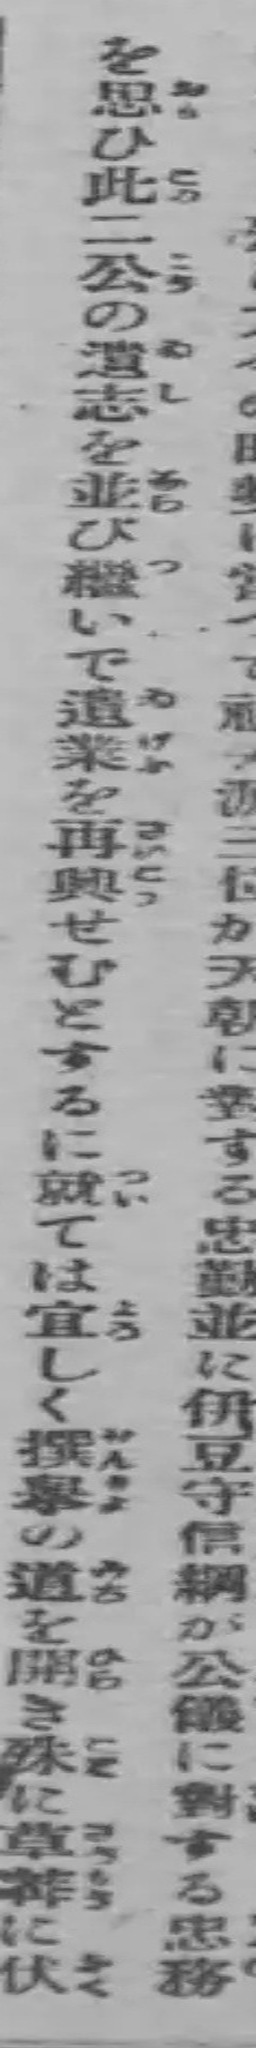を思ひ此二公の遺志を並び継いで遺業を再興せむとするに就ては宜しく撰挙の道を開き殊に草莽に伏
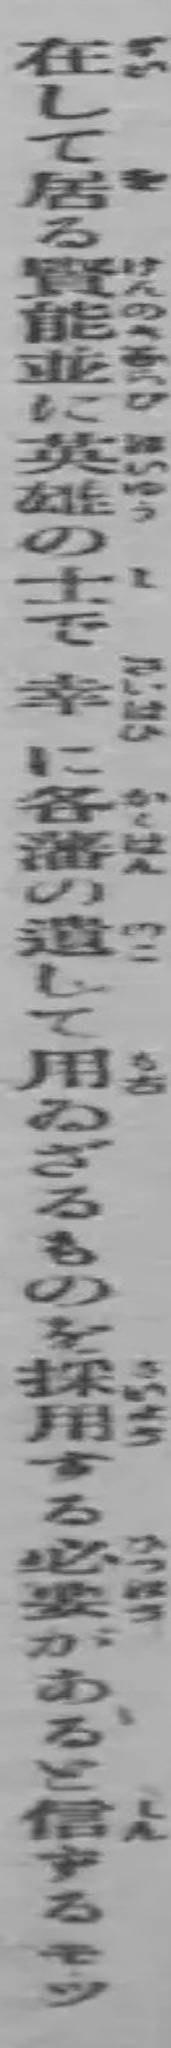在して居る賢能並に英雄の士で幸に各藩の遺して用ゐざるものを採用する必要があると信ずるモツ
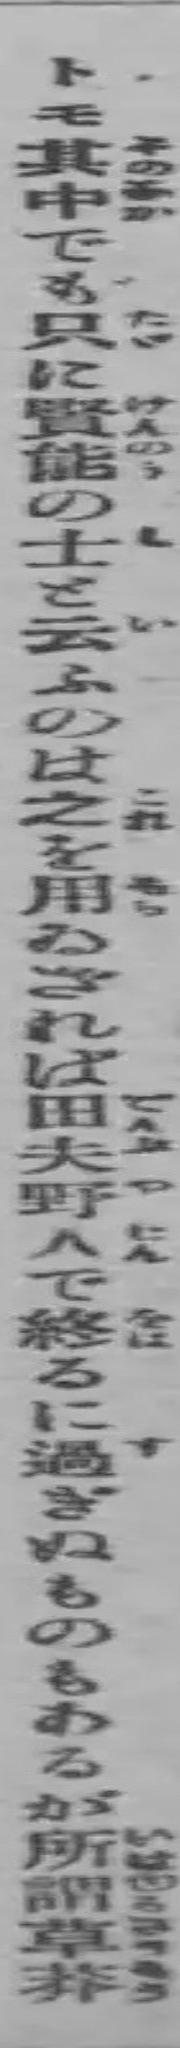トモ其中でも只に賢能の士と云ふのは之を用ゐざれば田夫野人で終るに過ぎぬものもあるが所謂草莽
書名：豊橋市史談
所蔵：国立国会図書館 National Diet Library, JAPAN
